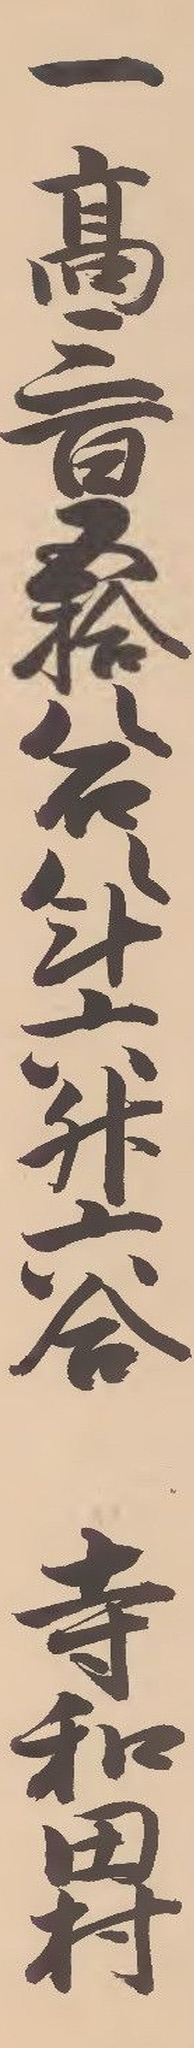一高三百五拾八石八斗六升六合寺和田村
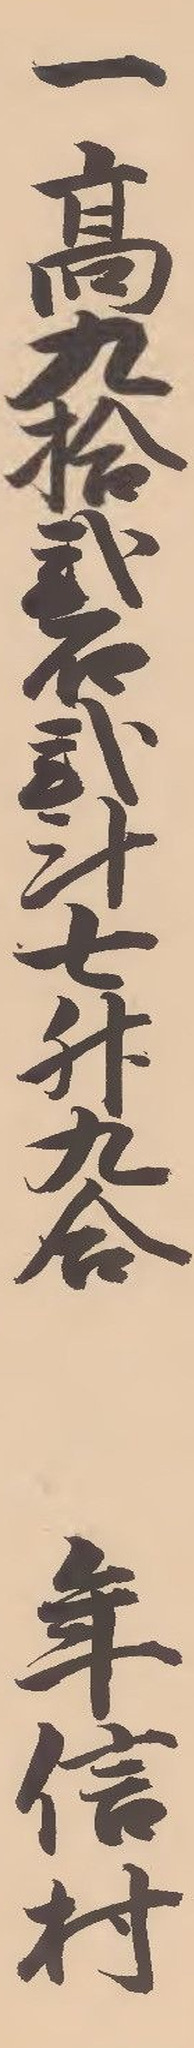一高九拾弐石弐斗七升九合年信村
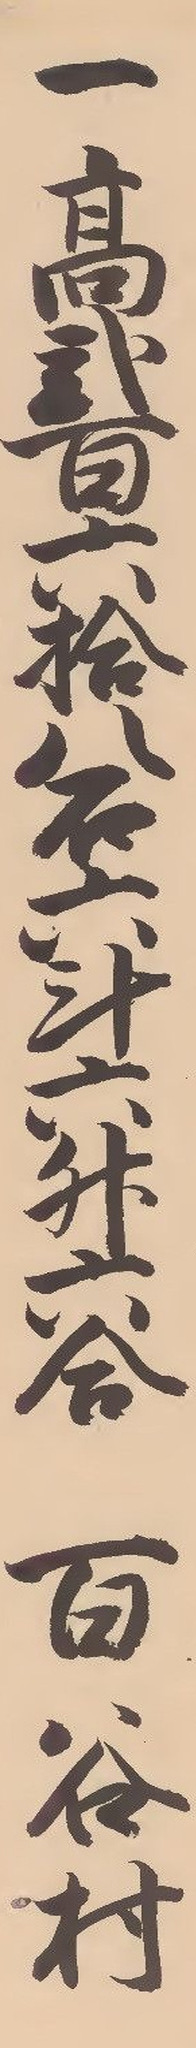一高弐百六拾八石六斗六升六合百谷村

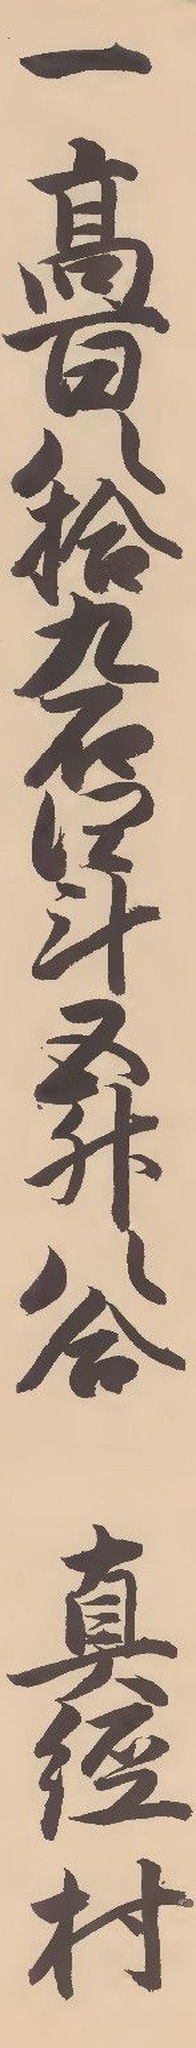一高百八拾九石四斗五升八合真経村
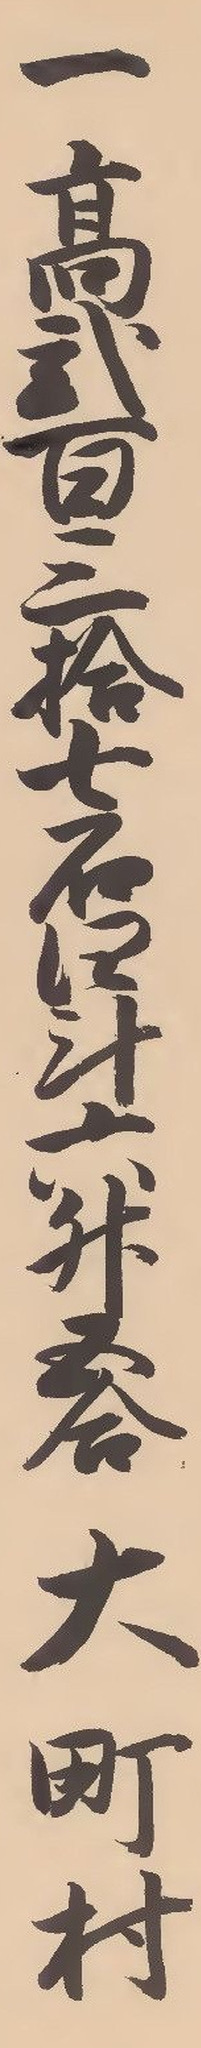一高弐百三拾七石四斗六升五合大町村
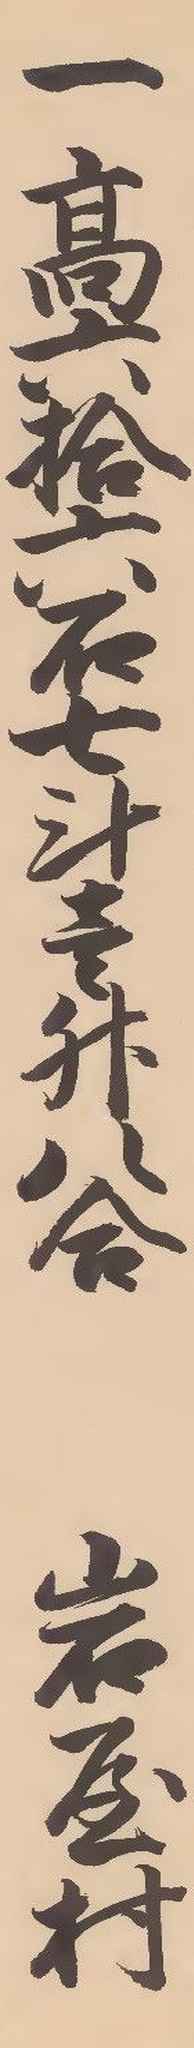一高六拾六石七斗壱升八合岩屋村
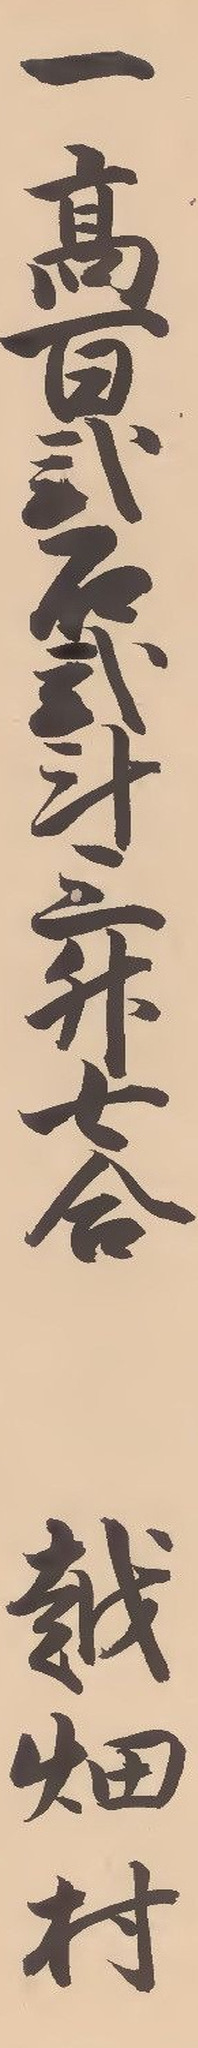一高百弐石弐斗三升七合越畑村
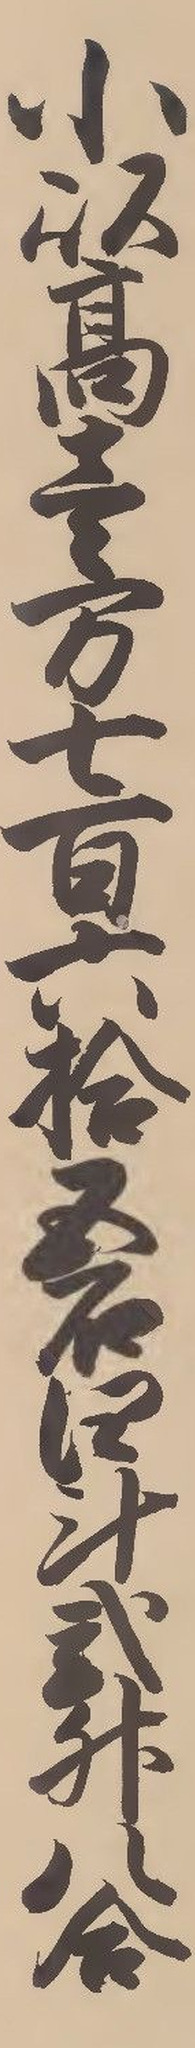小以高壱万七百六拾五石四斗弐升八合

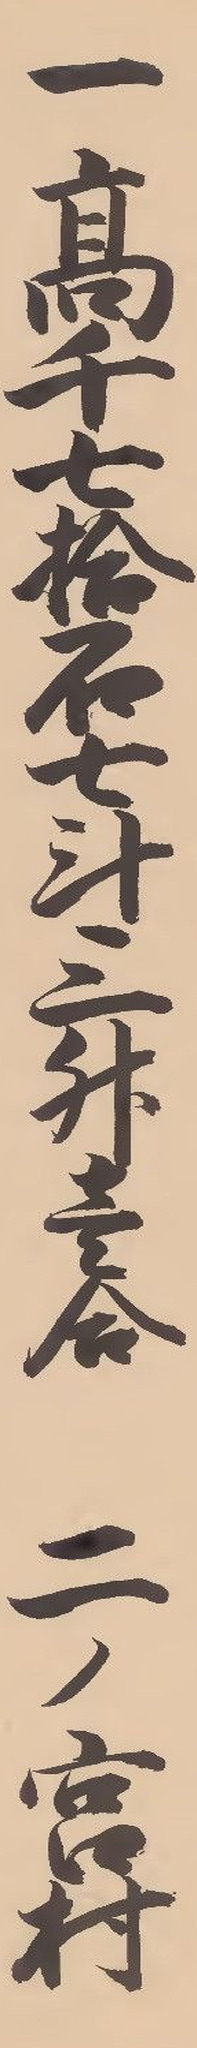一高千七拾石七斗三升壱合二ノ宮村
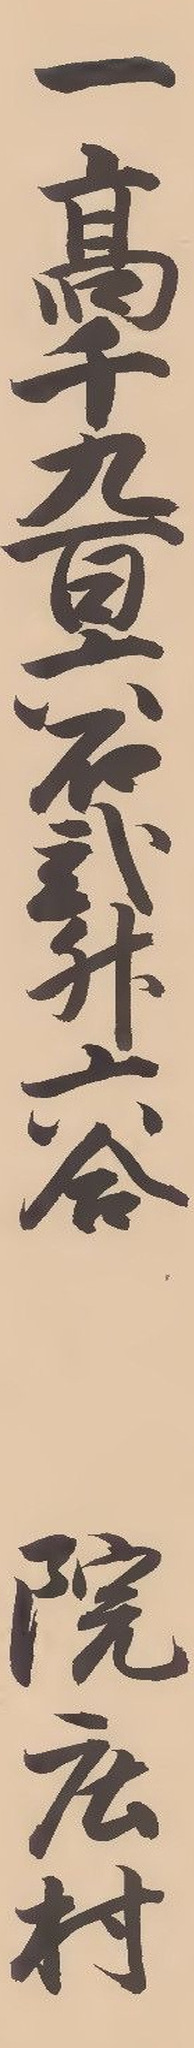一高千九百六石弐升六合院庄村
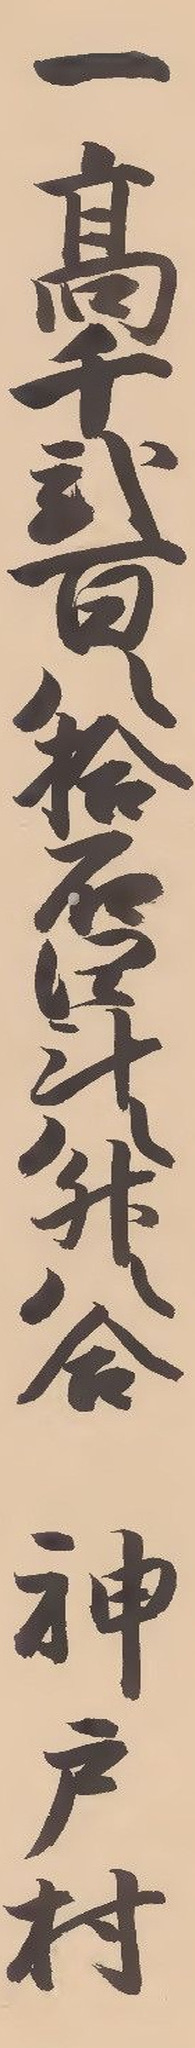一高千弐百八拾石四斗八升八合神戸村
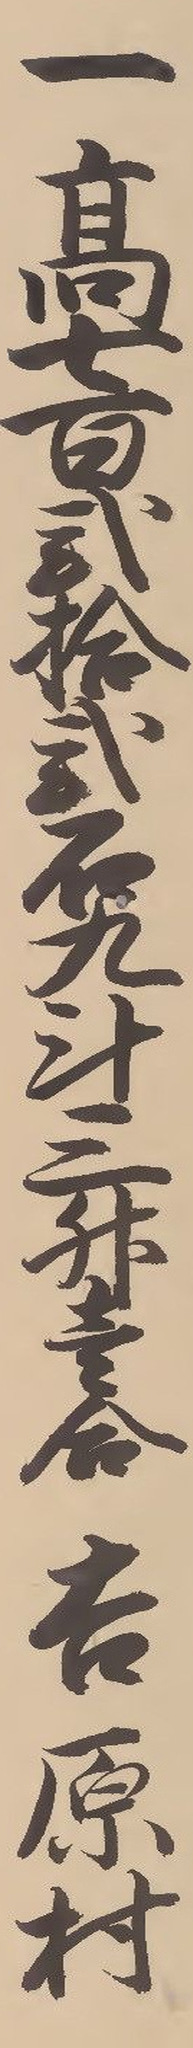一高七百弐拾弐石九斗三升壱合吉原村
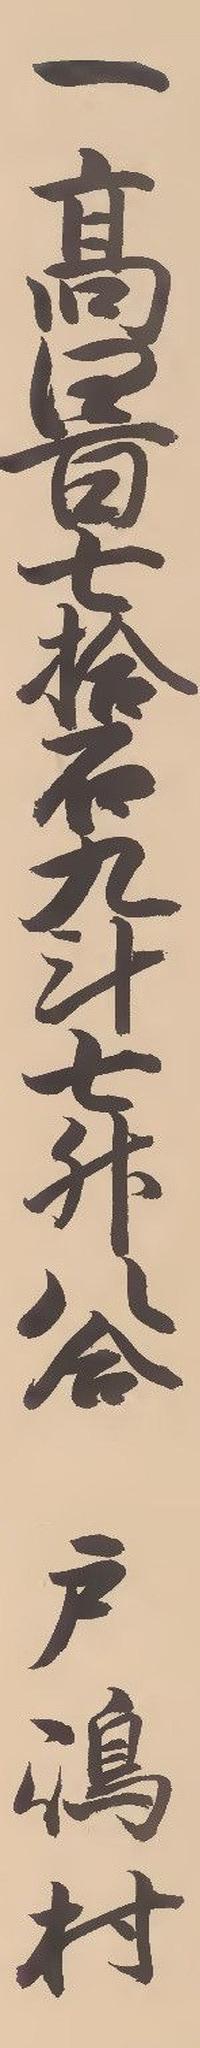一高四百七拾石九斗七升八合戸島村
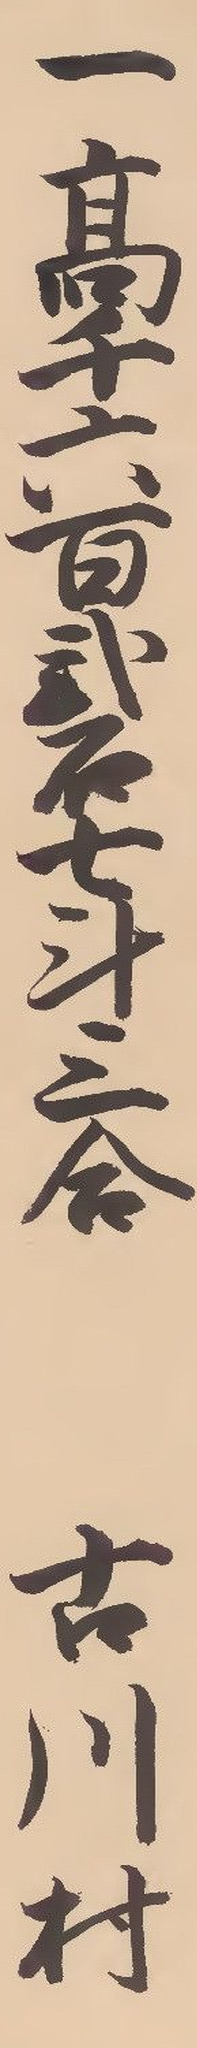一高千六百弐石七斗三合古川村
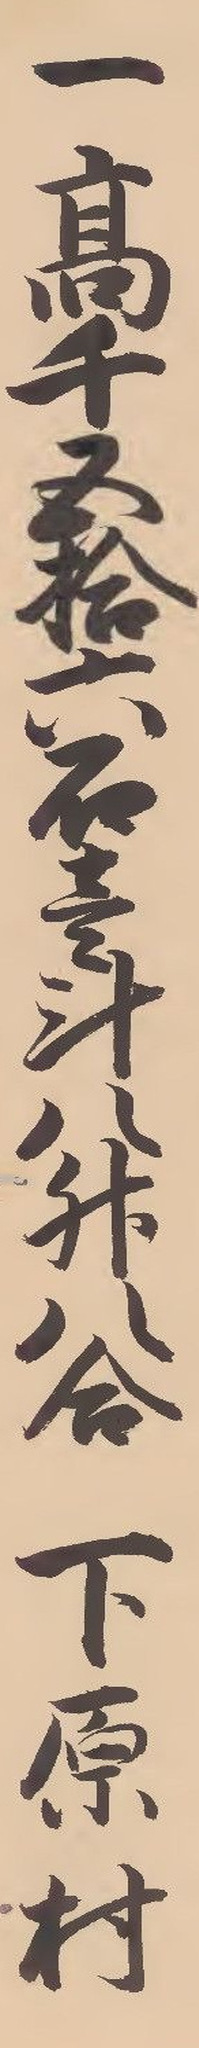一高千五拾六石壱斗八升八合下原村

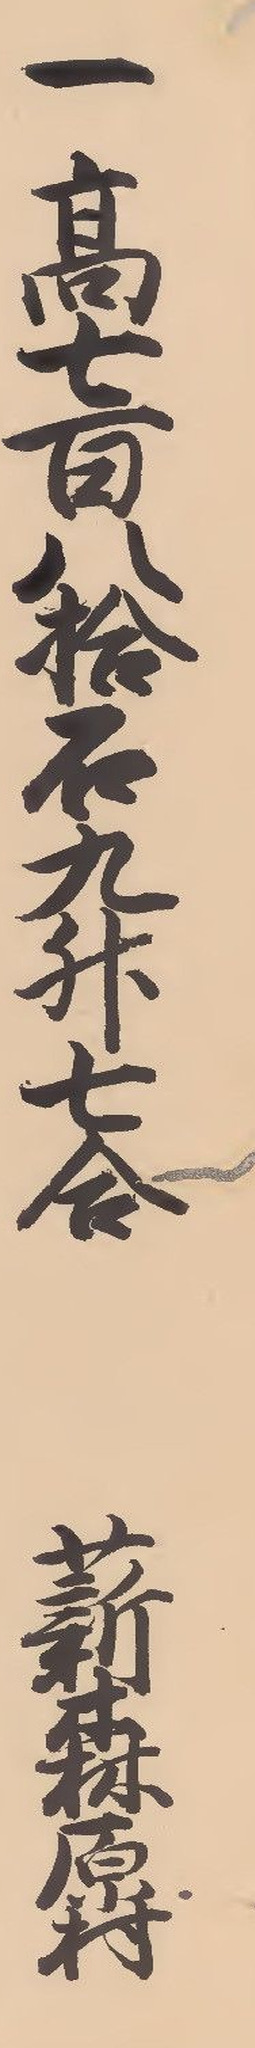一高七百八拾石九升七合薪森原村
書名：美作国郷帳
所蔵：国立公文書館 National Archives of Japan
